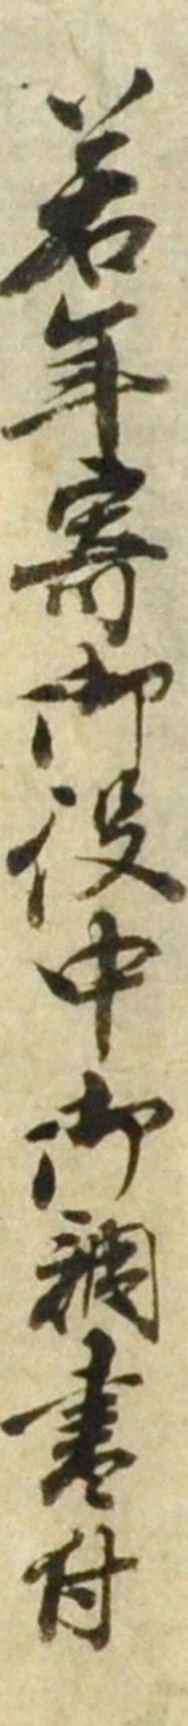若年寄御役中御調書付
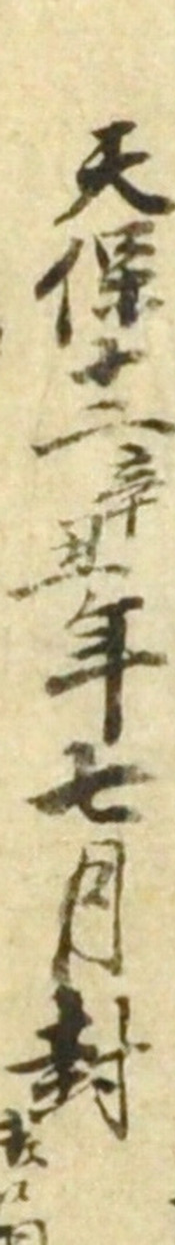天保十二辛丑年七月封

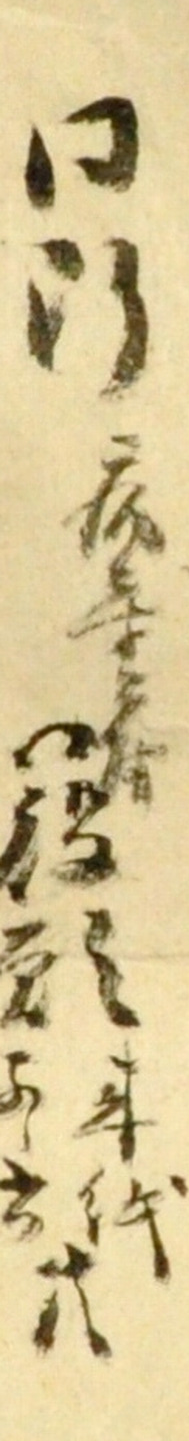同断病気ニ付
